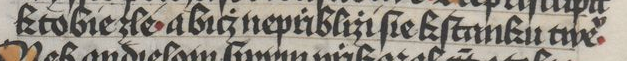ktobie zle.a bicż nepṙibliżi ſie kſtanku twev.
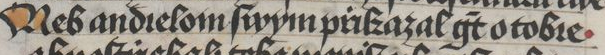Neb andielom ſwym pṙikazal ḡt otobie.
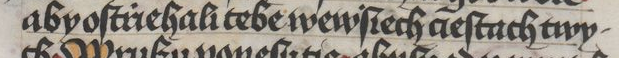aby oſtṙiehali tebe wewẛiech cieſtach twy¬
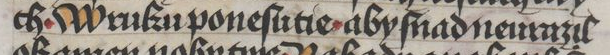ch.Wruku poneſu tie.aby ſnad neurazil
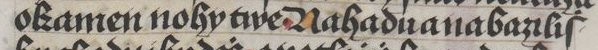okamen nohy twe.Nahadu a na baziliẛ¬
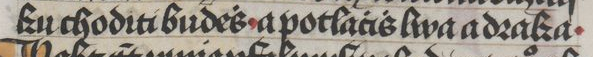ku choditi budeṡ.a potlaċiṡ lwa a draka.
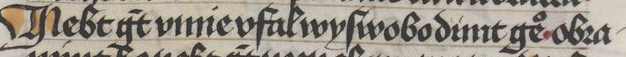Nebt ḡt vmie vfal wyſwobodint geo.obra¬
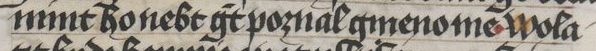nimt ho nebt ḡt poznal gmeno me.Wola¬
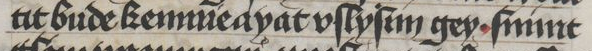tit bude kemune a yat vſlyẛim gey.ſnimt
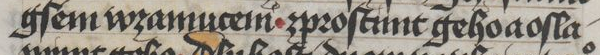gſem wzamuceni.zproſtimt geho a oſla¬
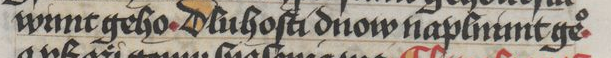wimt geho.Dluhoſti dnow naplnimt geo
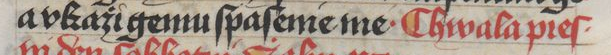a vkażi gemu ſpaſeníe me.Chwala pieſ¬
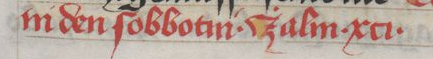ni den ſobbotni.Żalm.xci.
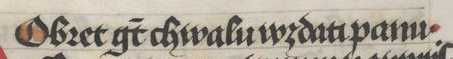Obret ḡt chwalu wzdati panu.
